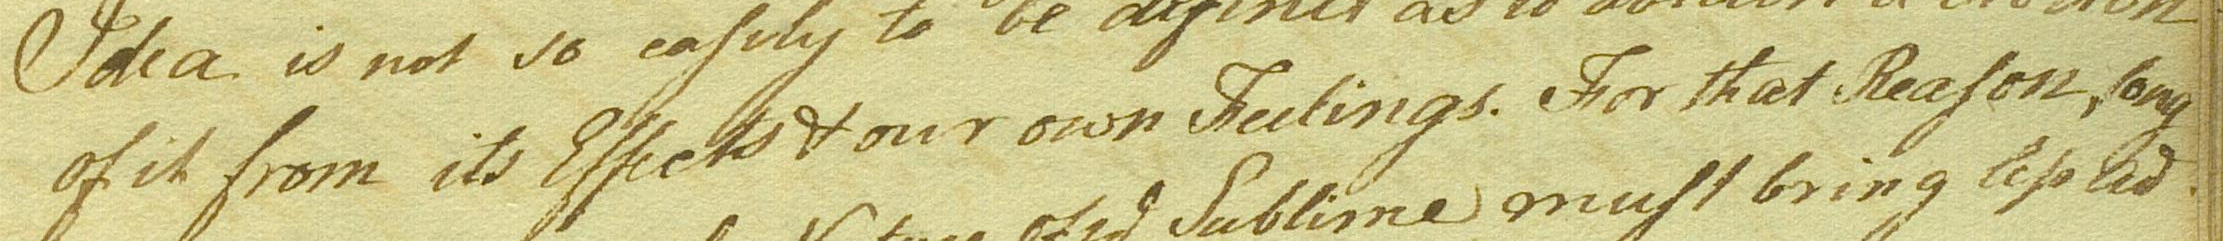of it from its Effects & our own Feelings. For that Reasons, any
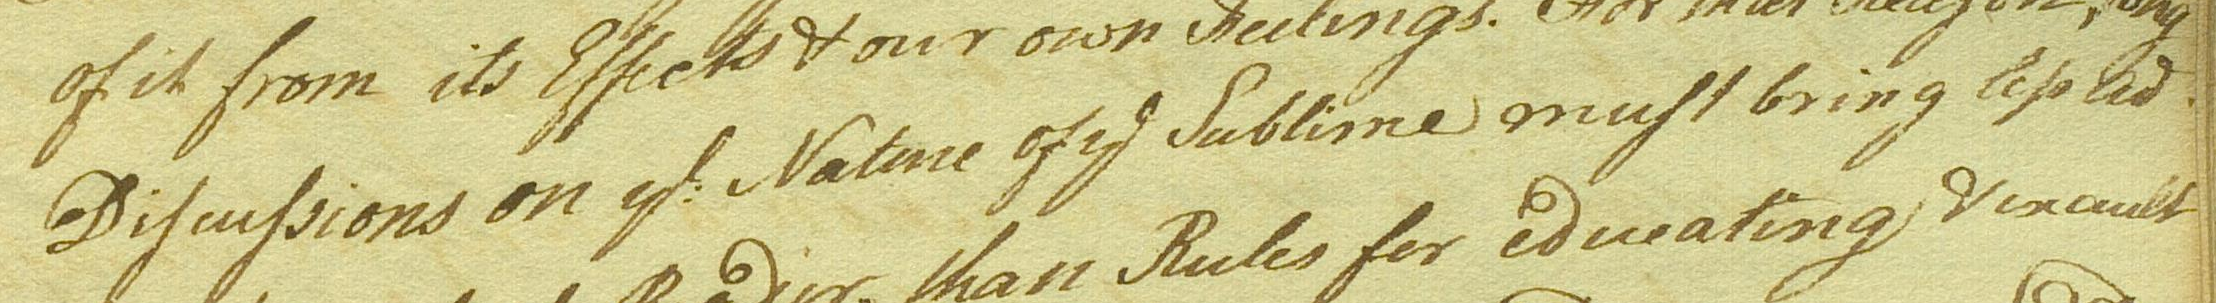Diffusions on y^e Nature of y^e Sublime must bring less ad
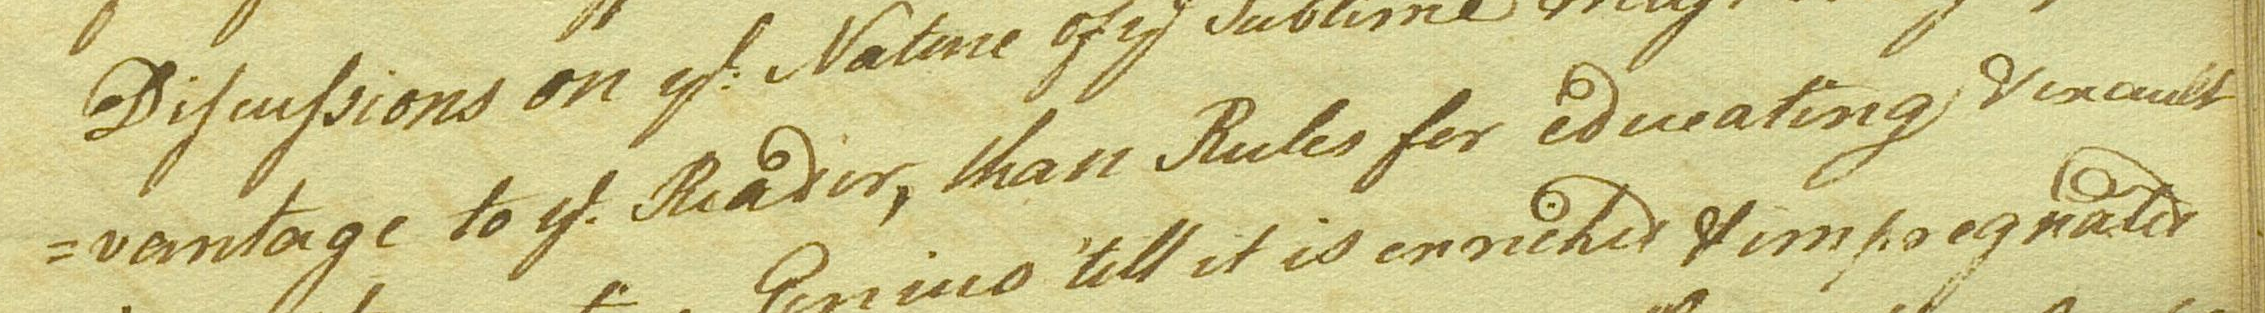-vantage to y^e Reader, than Rules for educating & exceed
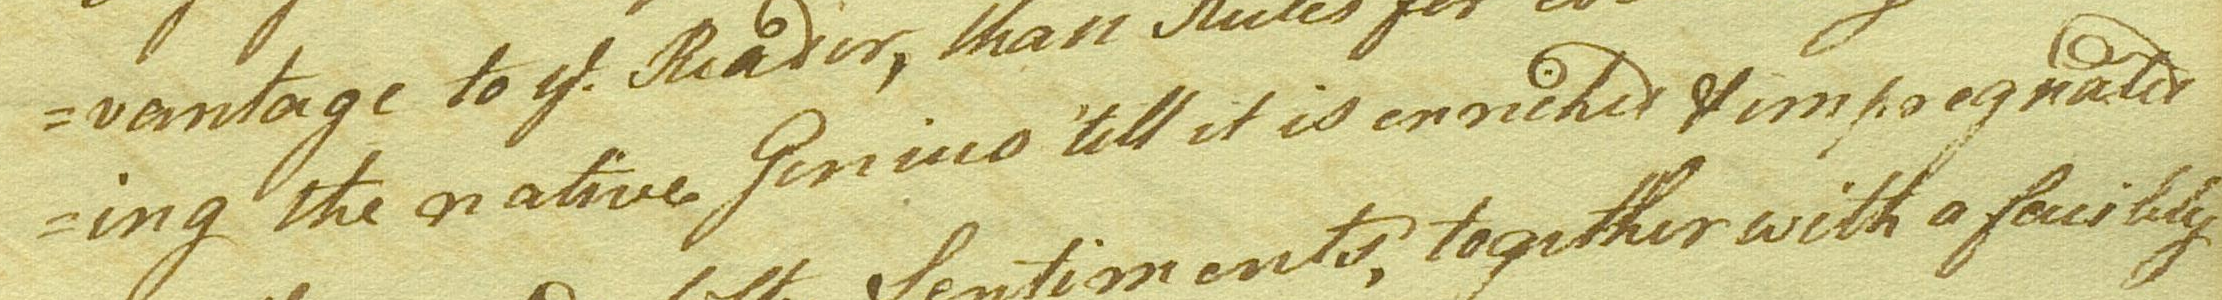-ing the native Genius till it is enriched & impregnated
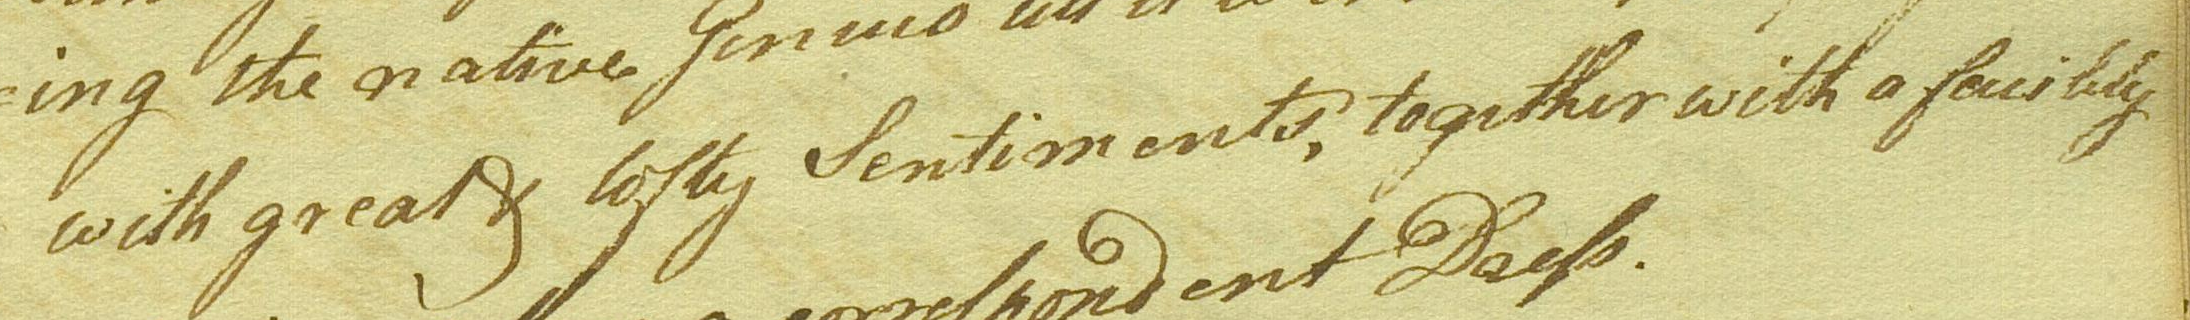with great & lofty Sentiments, together with a facility
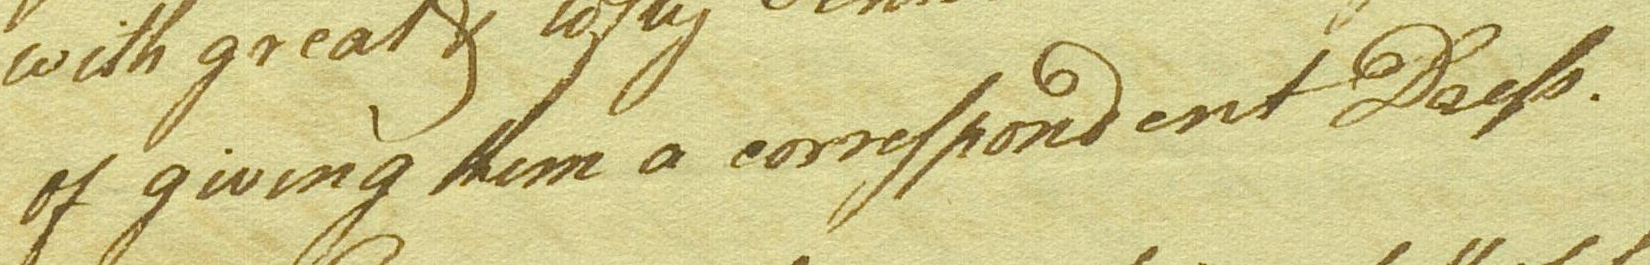of giving them a correspondent Dress.
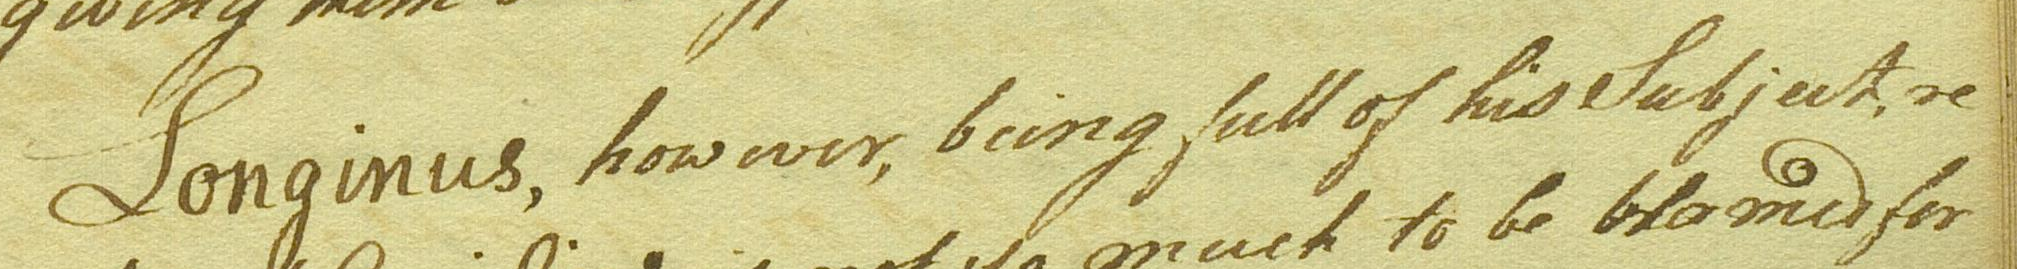Longinus, however, being full of his Subject, re
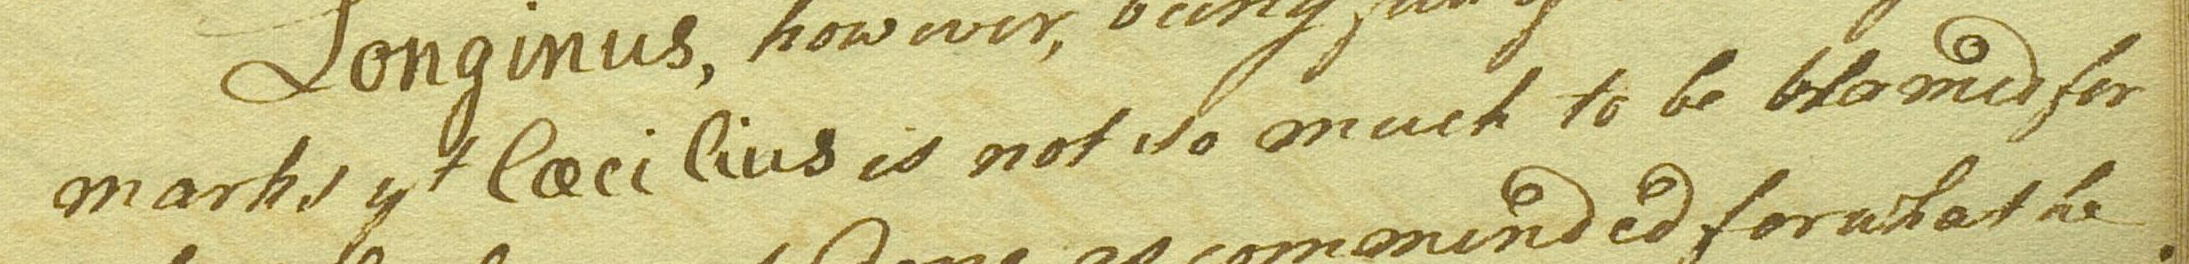marks y^t Caecilius is not so much to be blamed for
